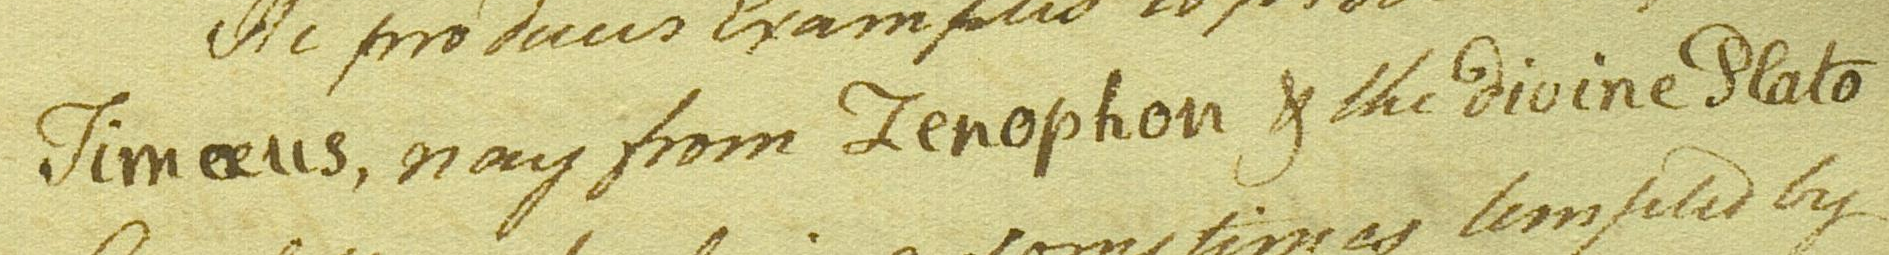Timaeus, nay from Xenophon & the divine Plato
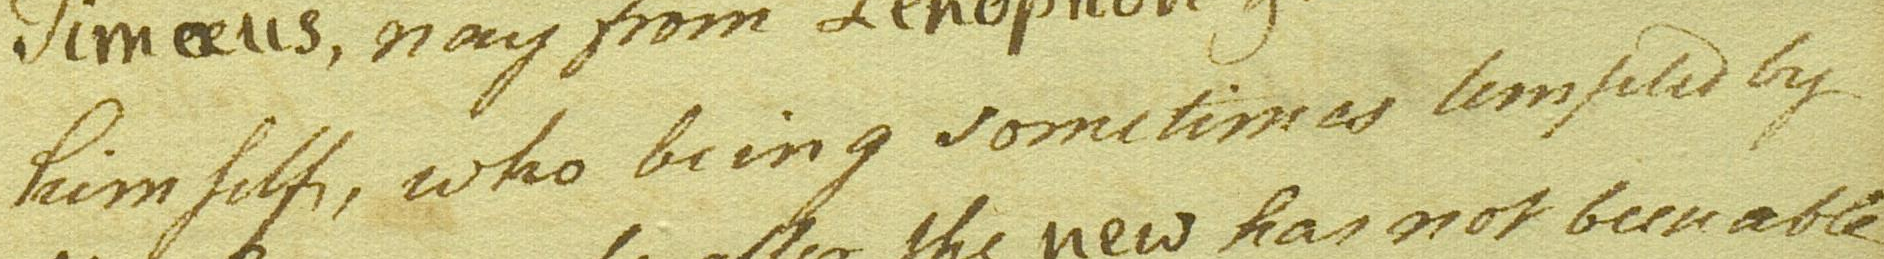himself, who being sometimes tempted by
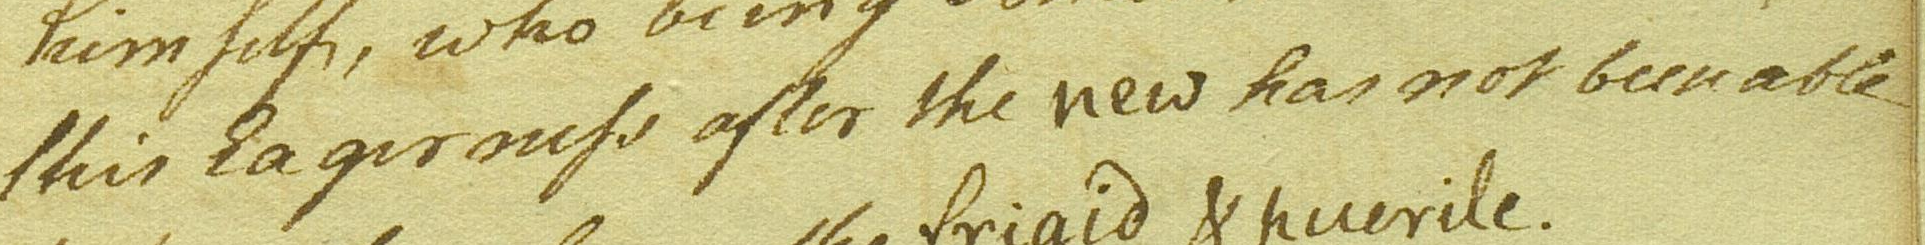this Eagerness after the new has not been able
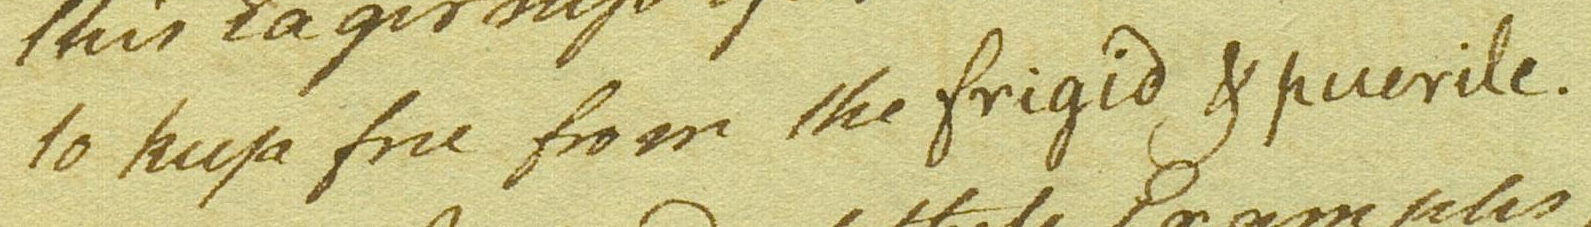to keep free from the frigid & puerile.
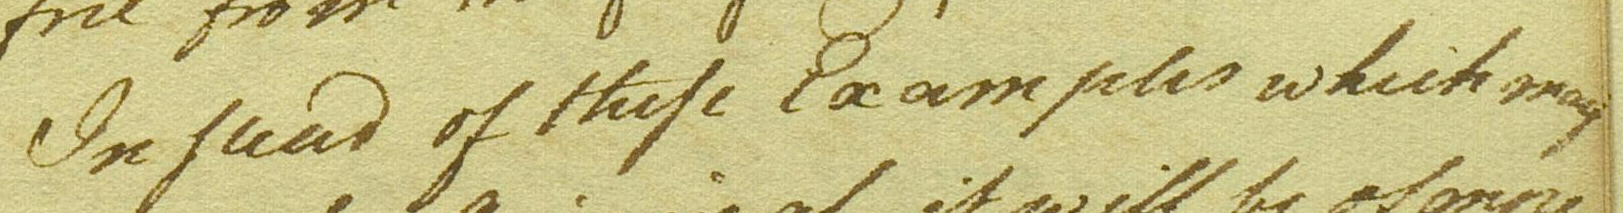Instead of these Examples which may
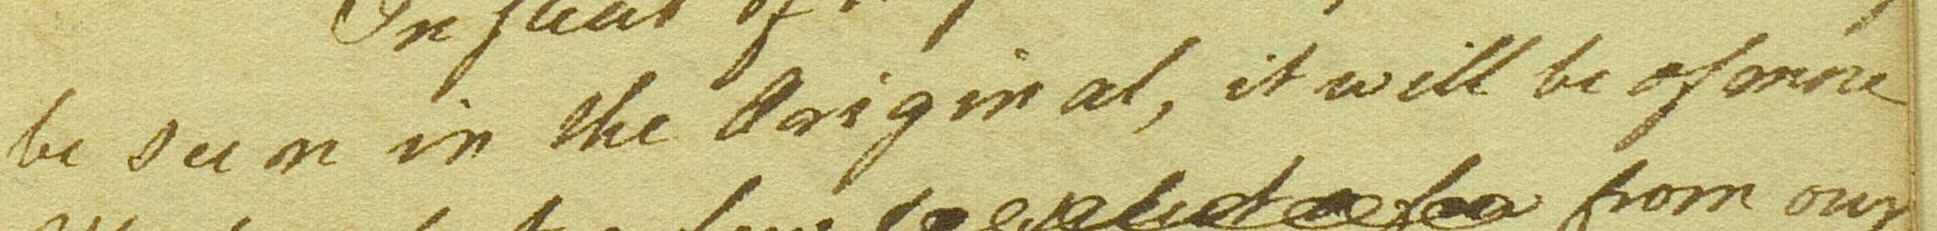be seen in the Original, it will be of more
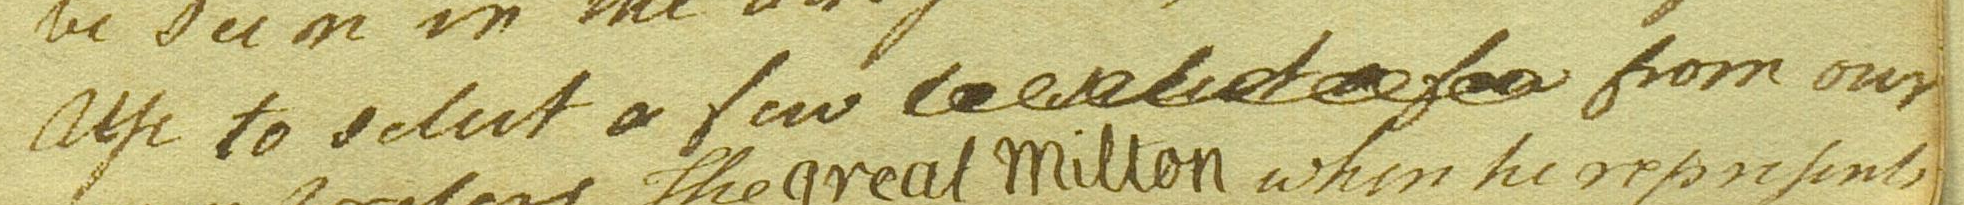Use to select a few [__________] from our
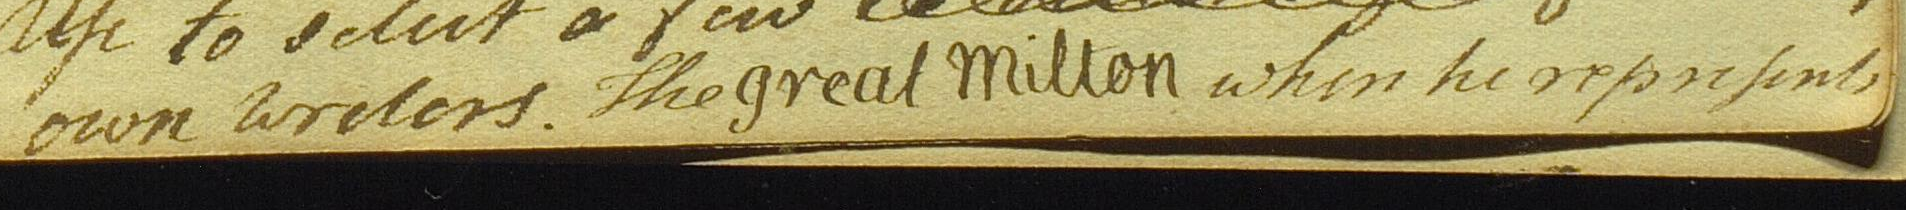own writers. The great Milton when he represents
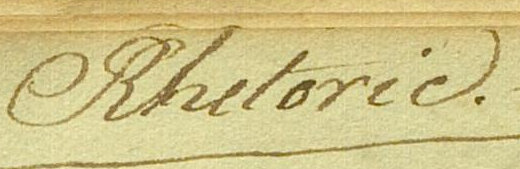Rhetoric.
